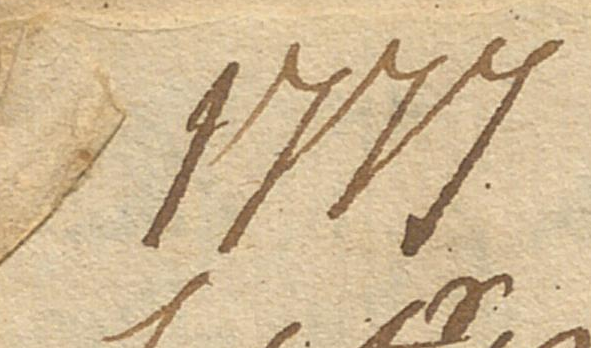1777
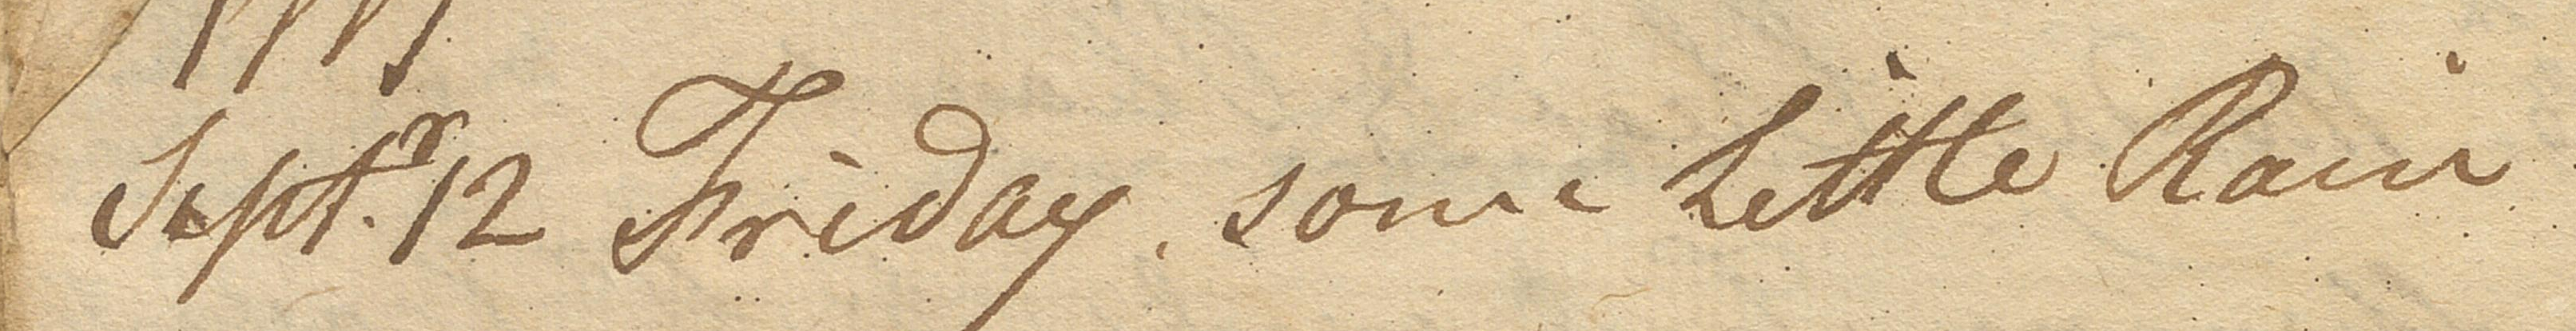Sept^r. 12 Friday, some Little Rain
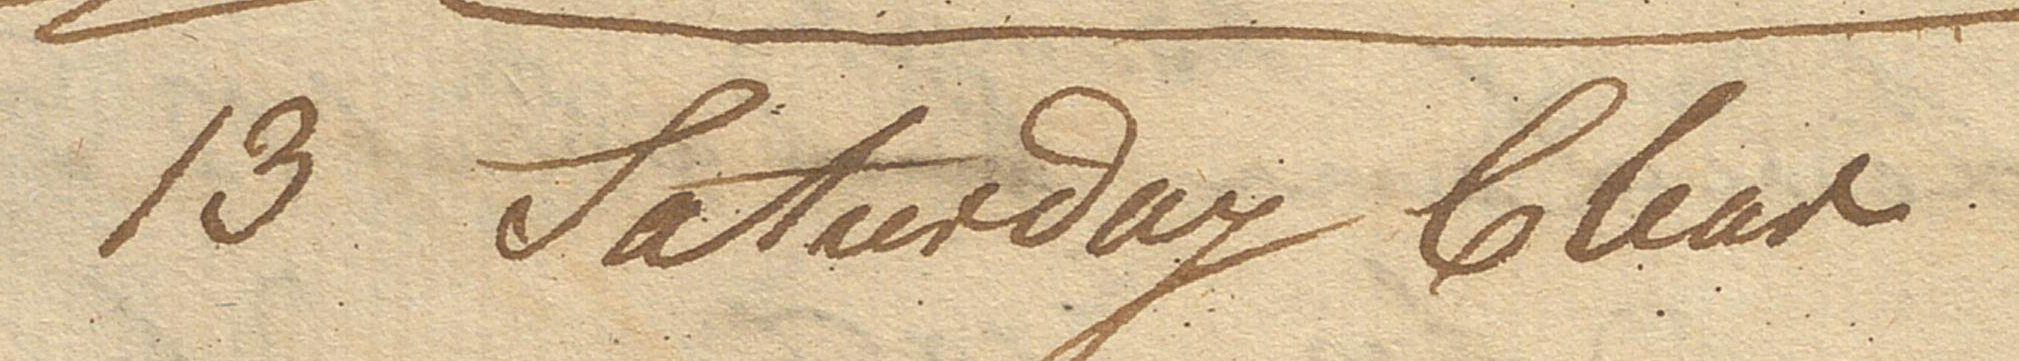13 Saturday Clear
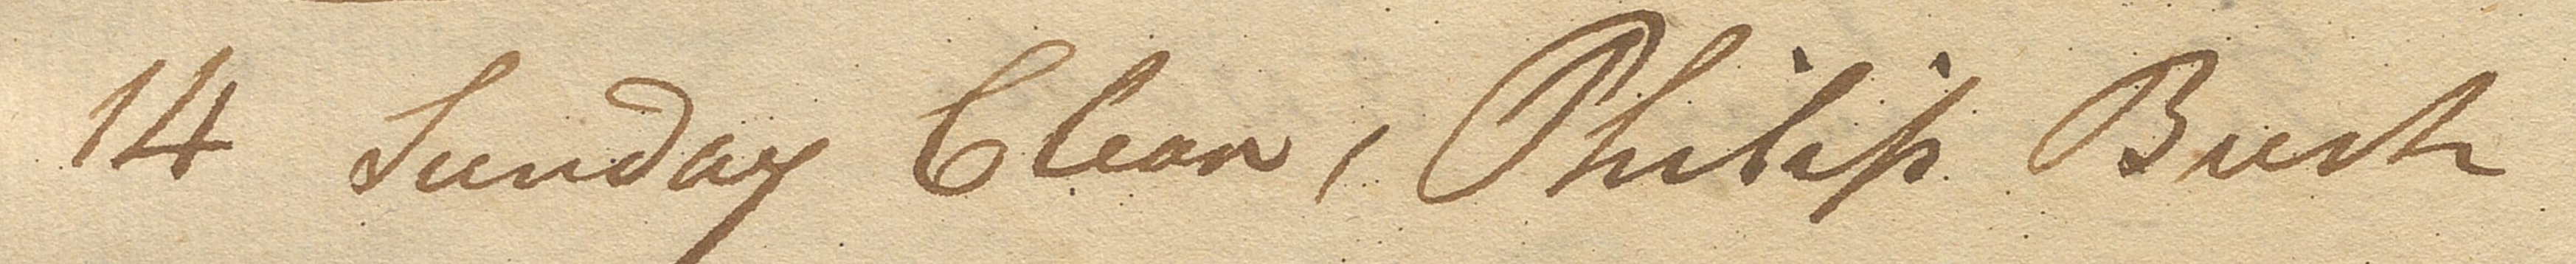14 Sunday Clear, Philip Bush
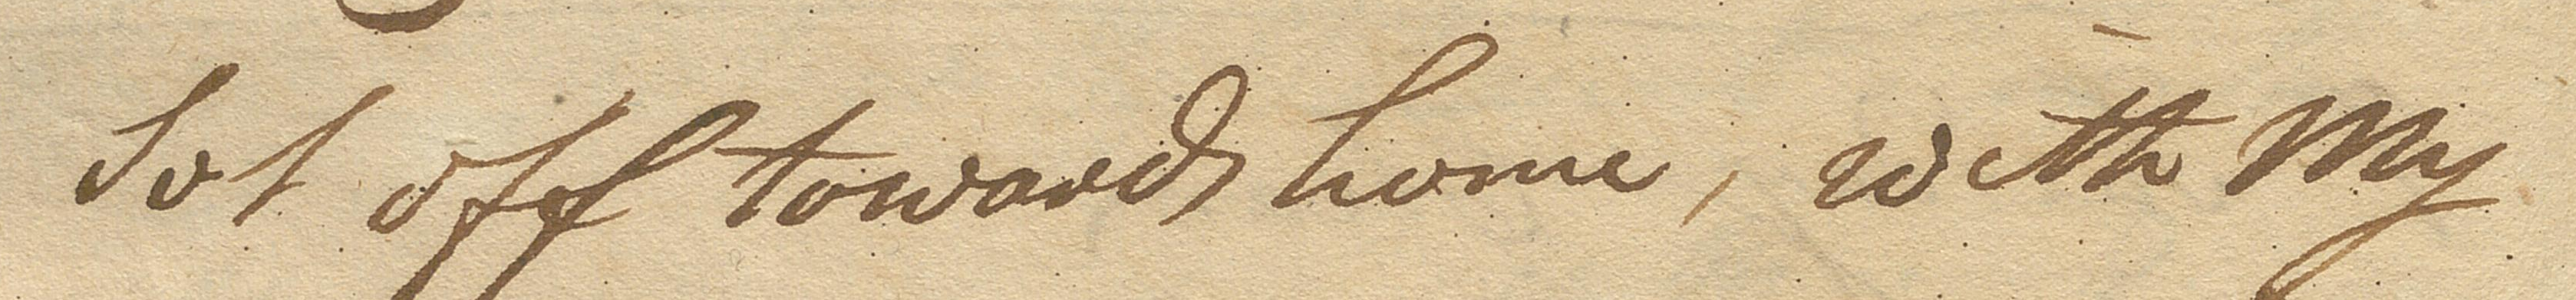Set off towards home, with My
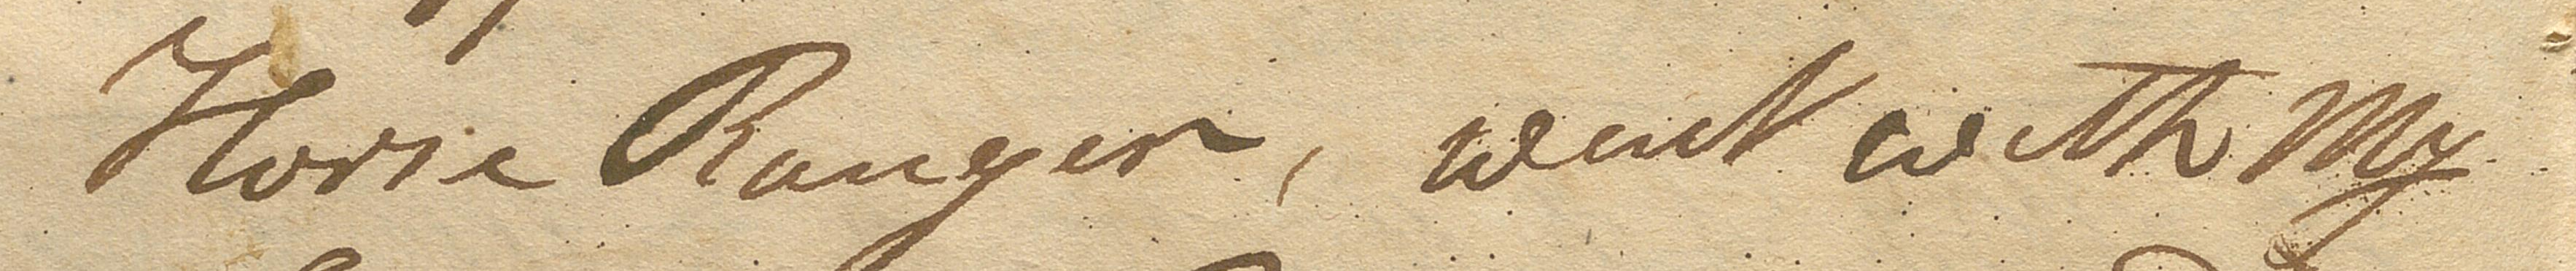Horse Ranger, went with My
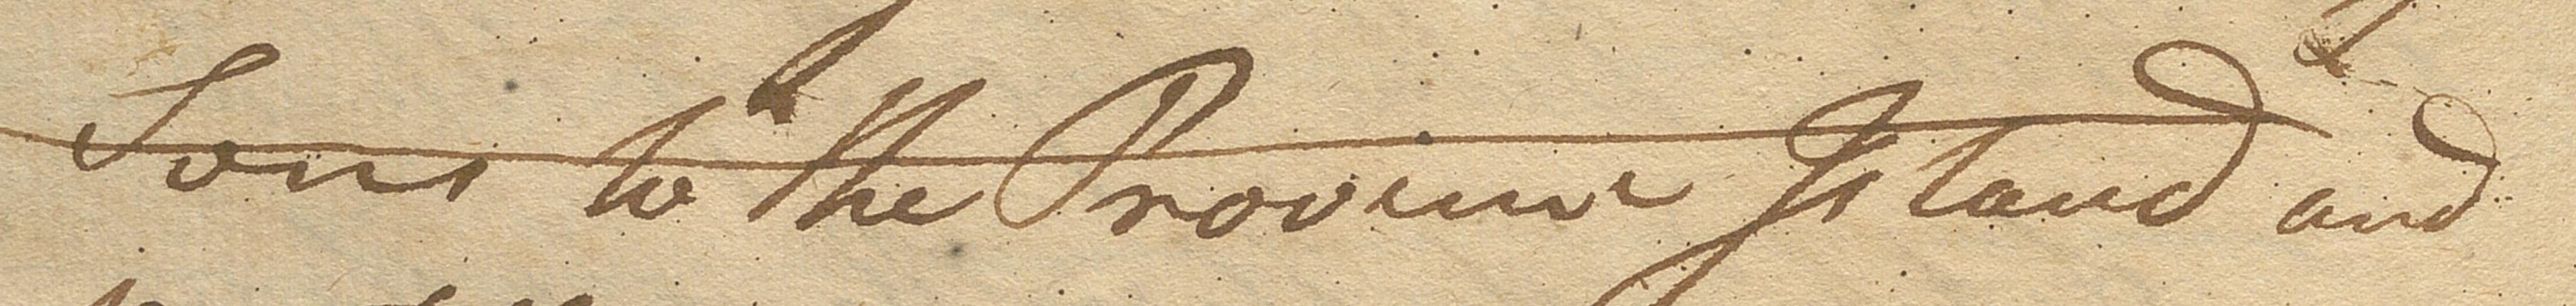sons to the Province Island and
